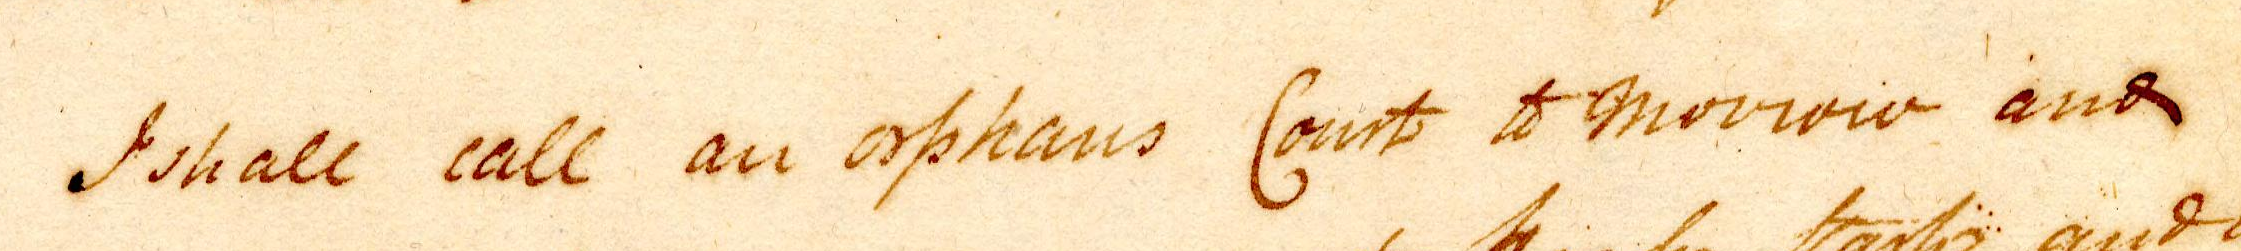I shall call an orphans Court to morrow and
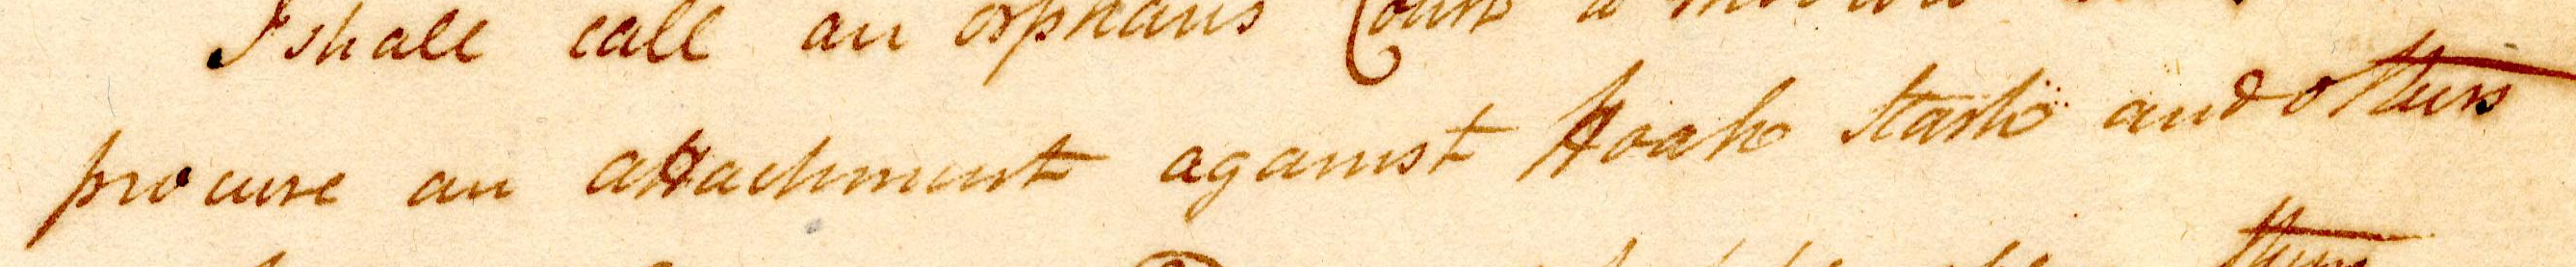procure an attachment against Hoak Stark and others
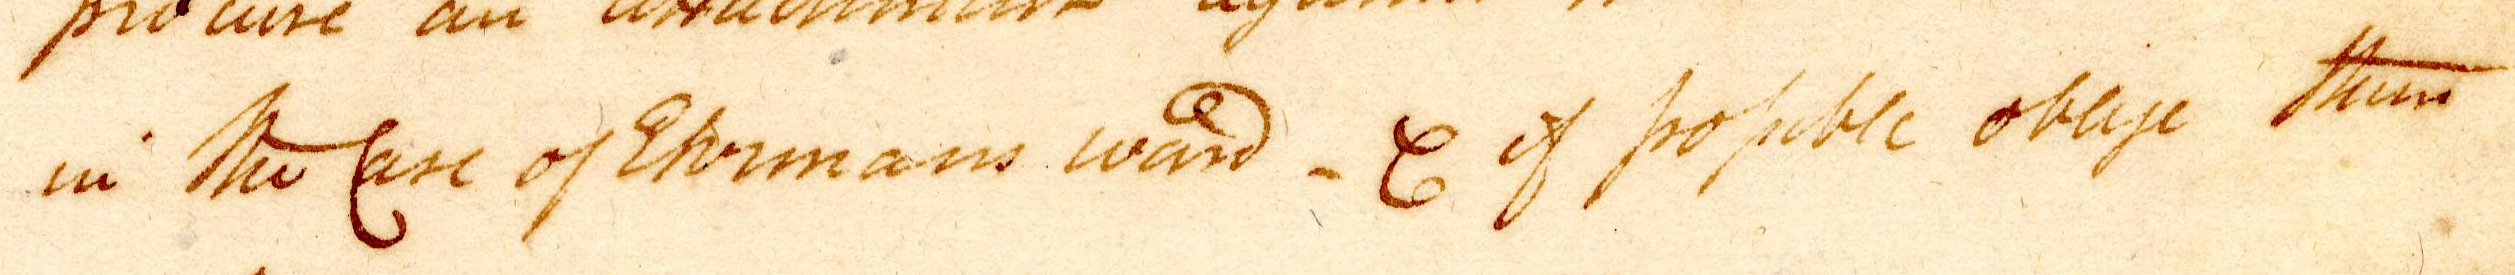in the Care of Eprmans ward & if possible oblige them
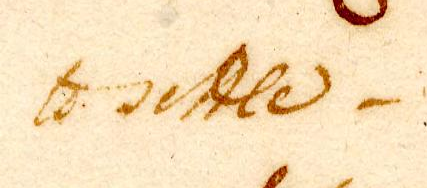to settle.
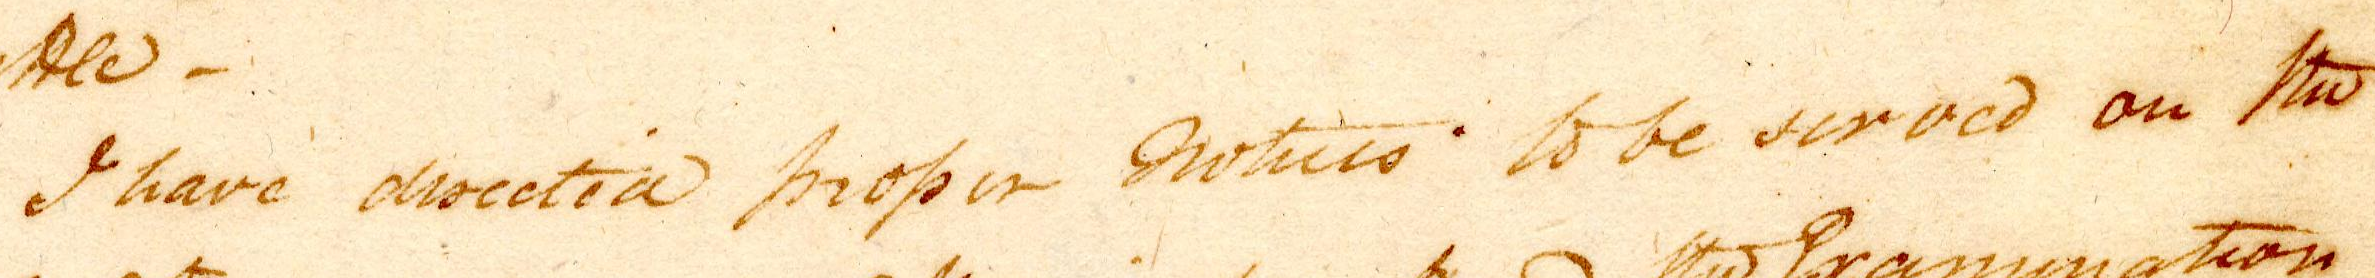I have disected proper duties to be served on the
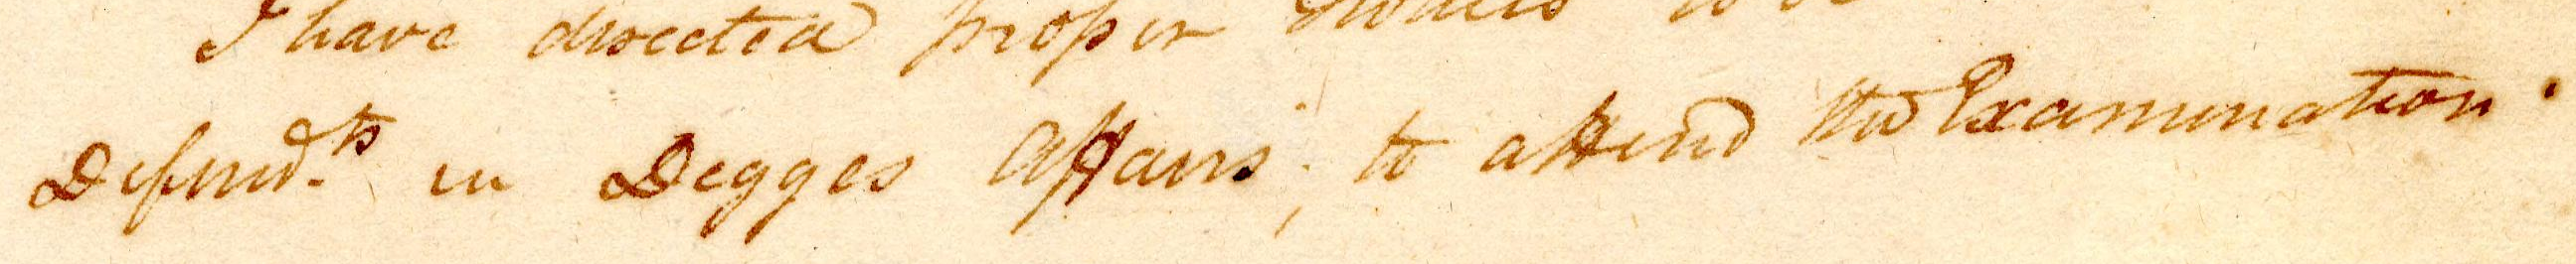Defend^t in Degges Affairs to attend the Examination
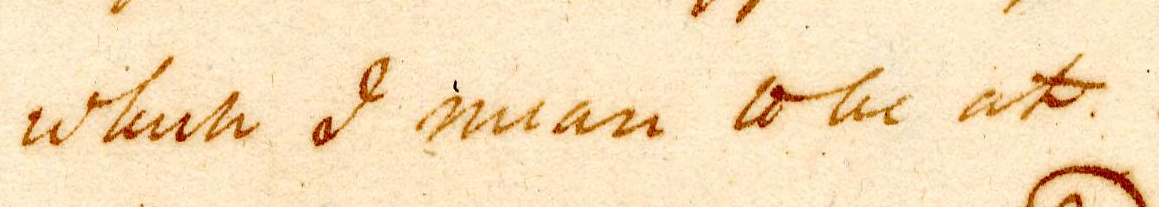which I mean to be at
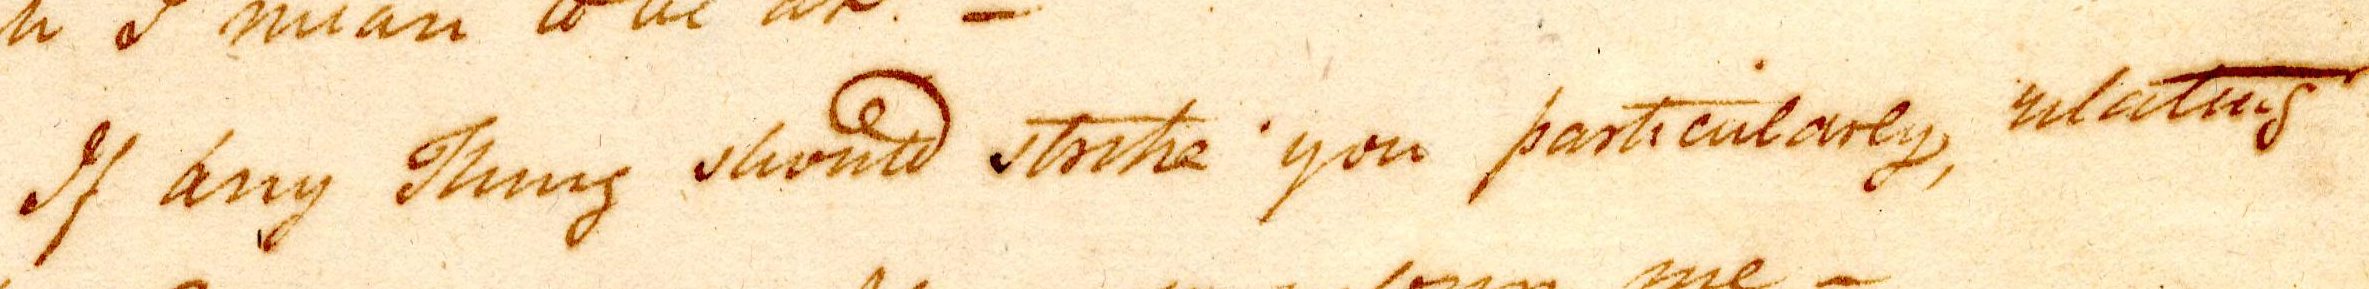If any Thing should strike you particularly, relating
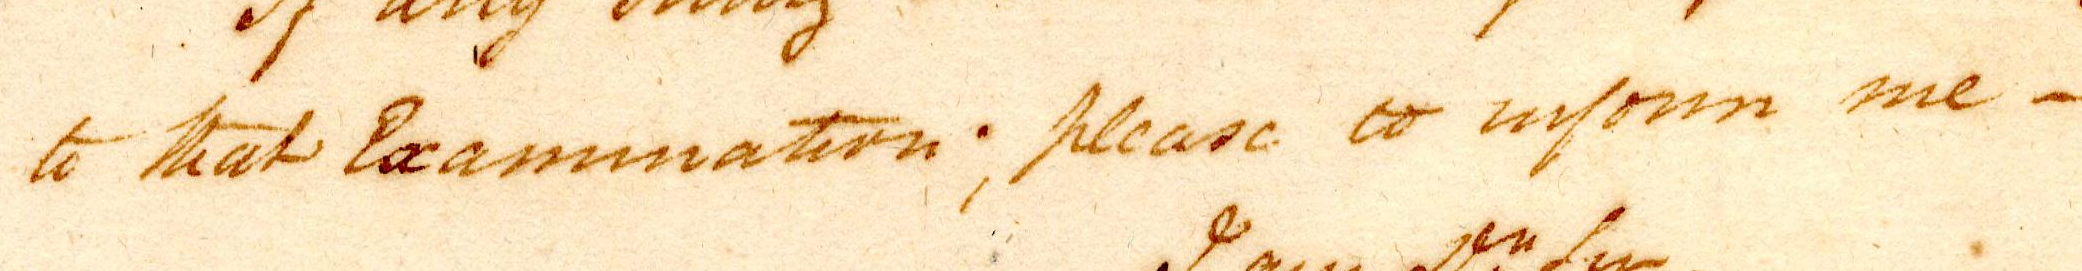to that Examination; please to inform me.
